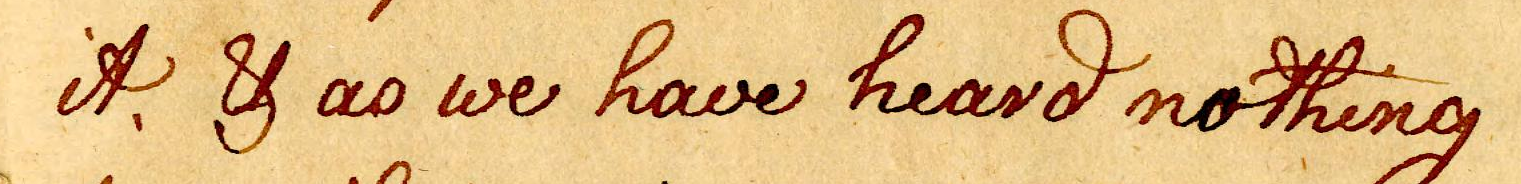it. & as we have heard nothing
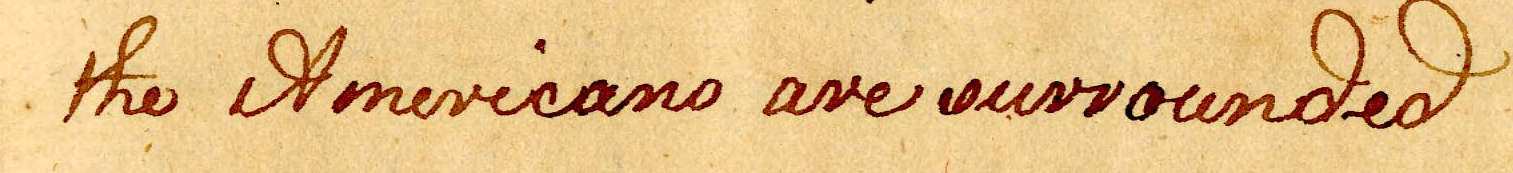the Americans are surrounded
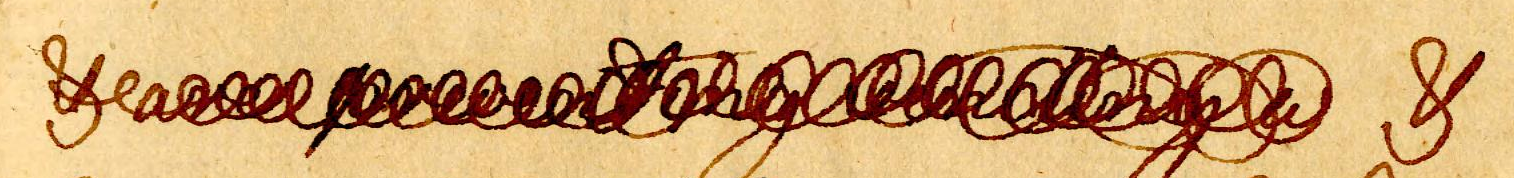[_______________________] &
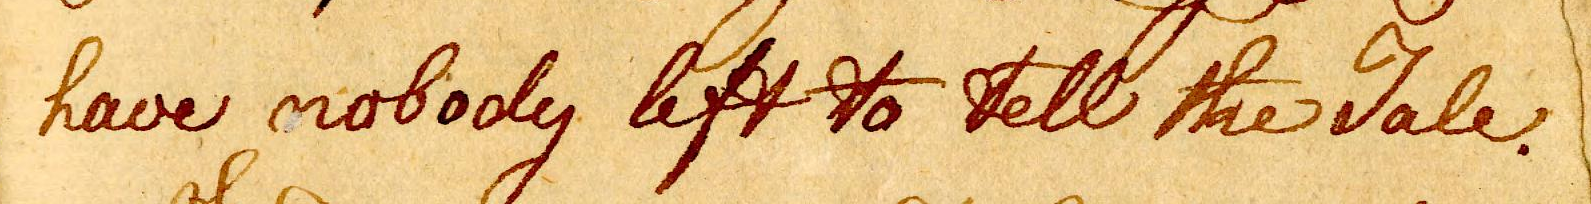have nobody left to tell the Tale.
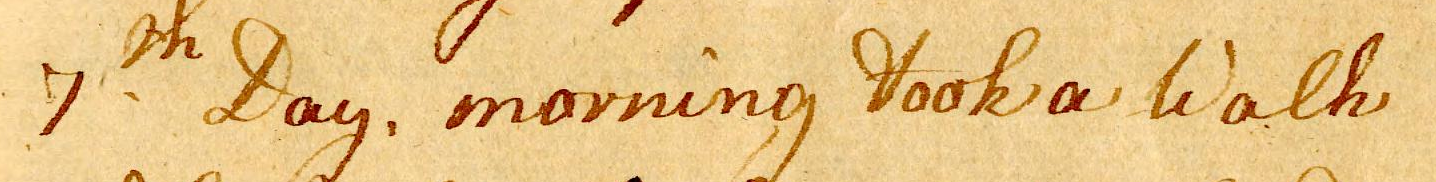7^th Day. morning took a Walk
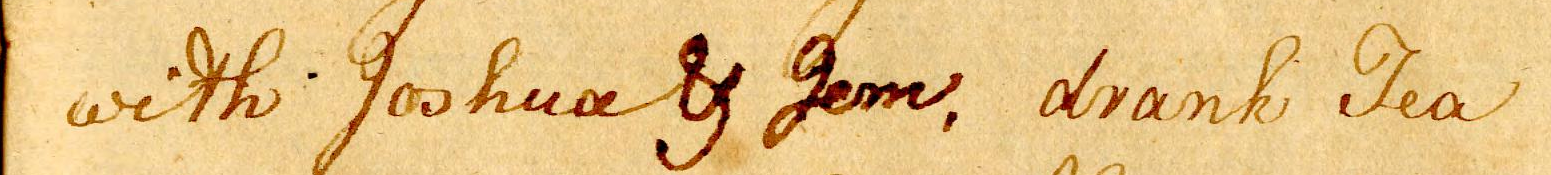with Joshua & Jem, drank Tea
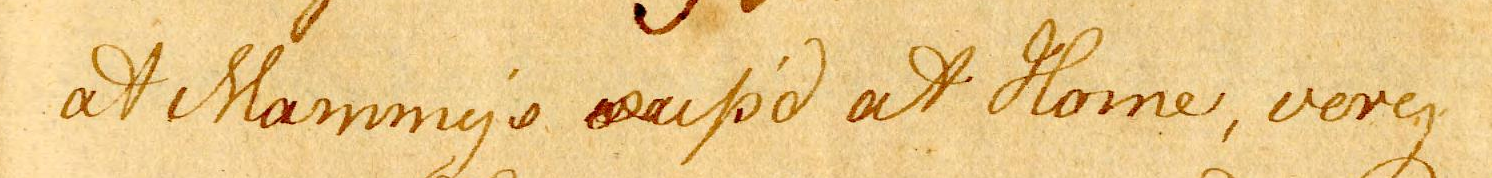at Mammy's sup'd at Home, very
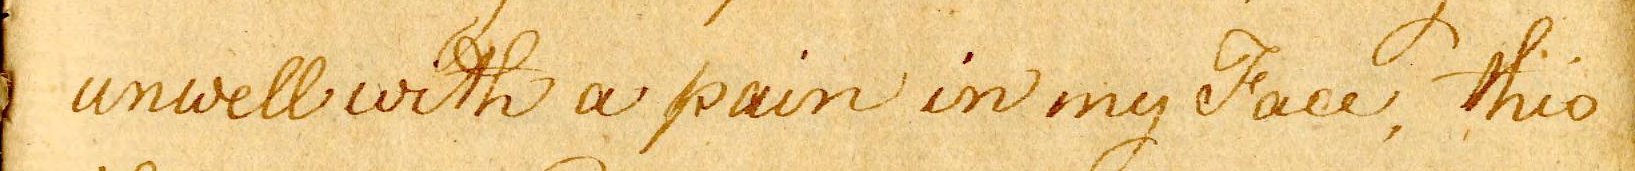unwell with a pain in my Face, this
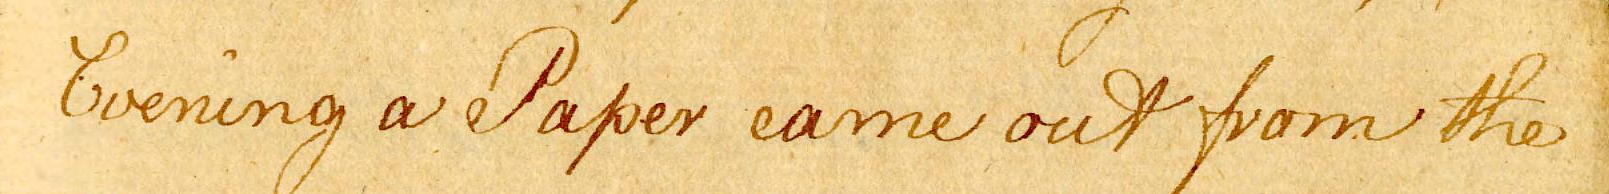Evening a Paper came out from the
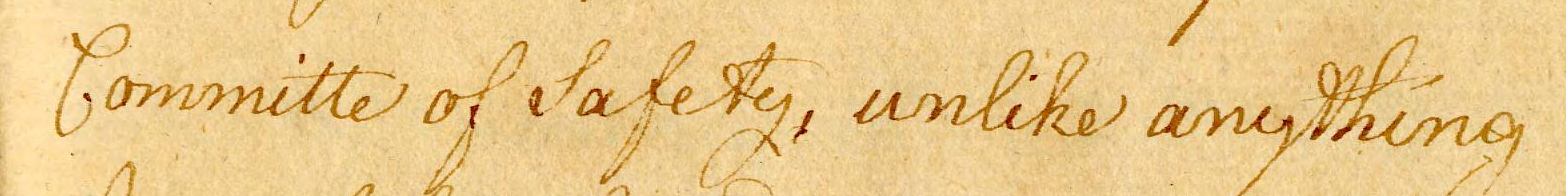Committe of Safety, unlike anything
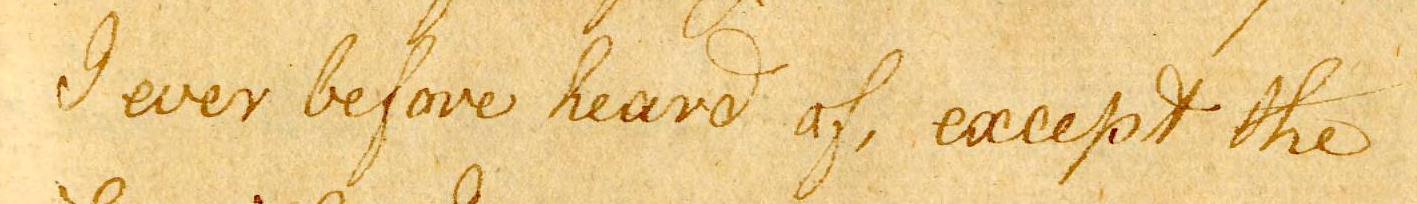I ever before heard of, except the
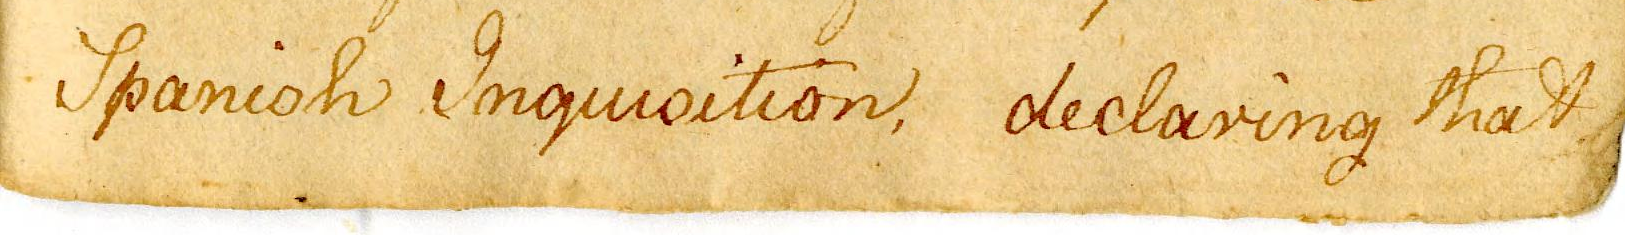Spanish Inquisition, declaring that
